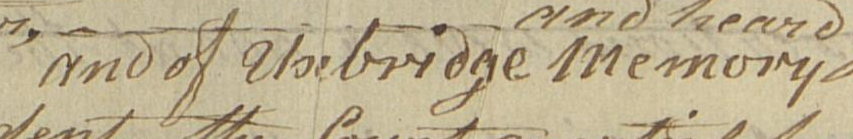and of Uxbridge Memory
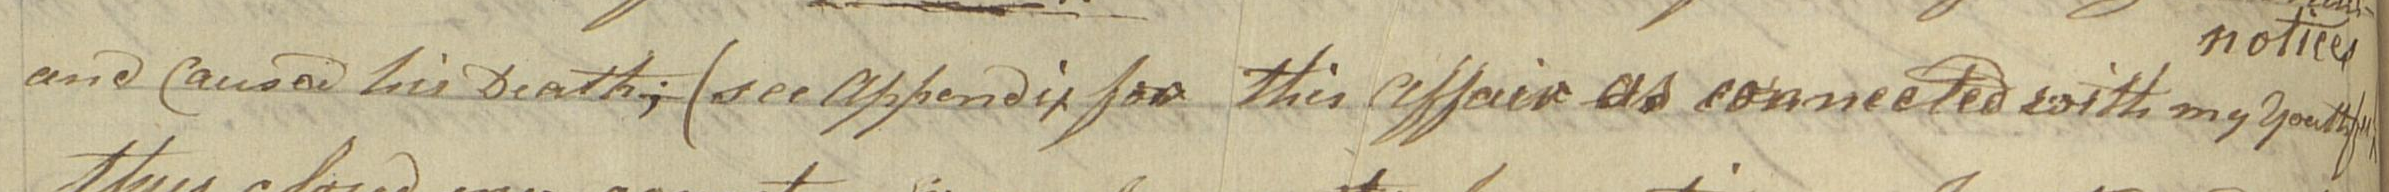and Caused his Death; (see Appendix for this Affair as connected with my Youth-
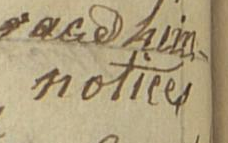notices
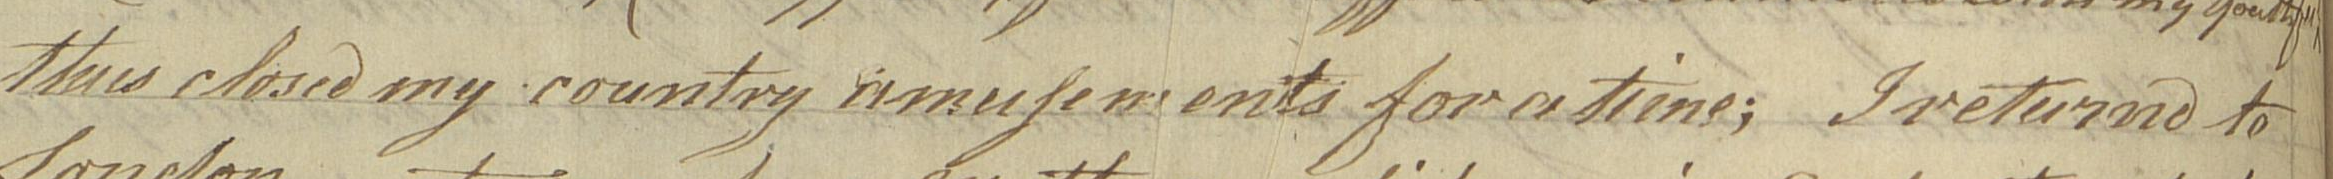thus closed my country amusements for a time; I returnd to
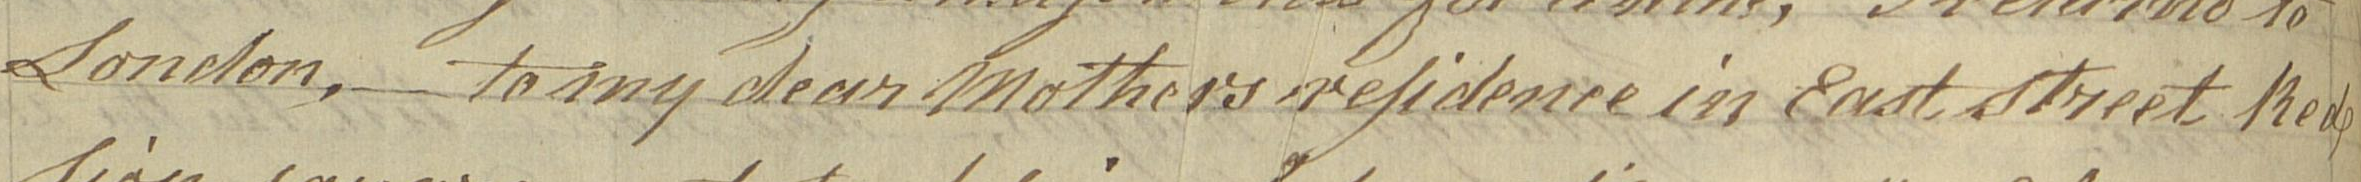London, to my dear Mothers residence in East street Red
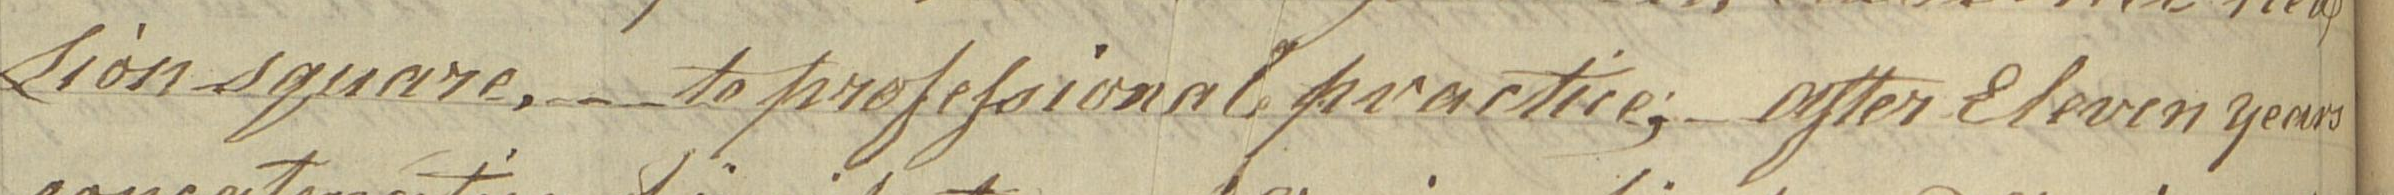Lion square, to professional practice; after Eleven years
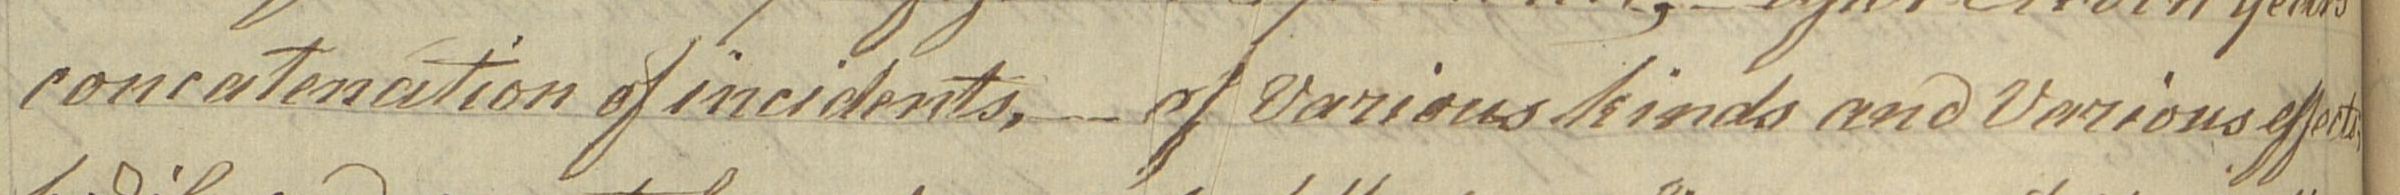concentration of incidents, of Various kinds and Various effects
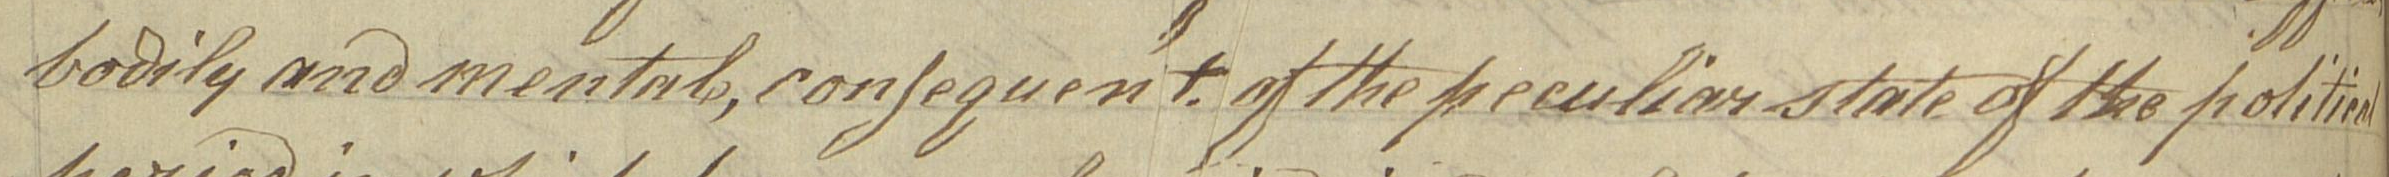bodily and mental, consequent of the peculiar state of the political
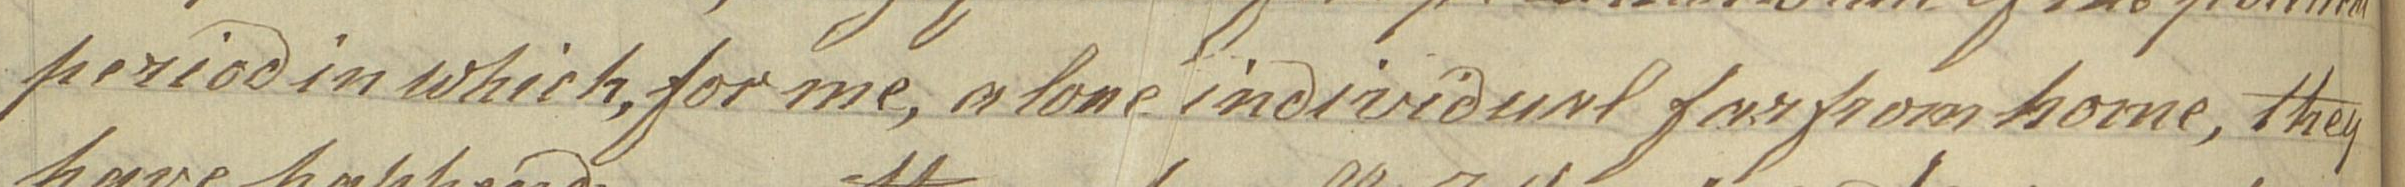period in which, for me, alone individual far from home, they
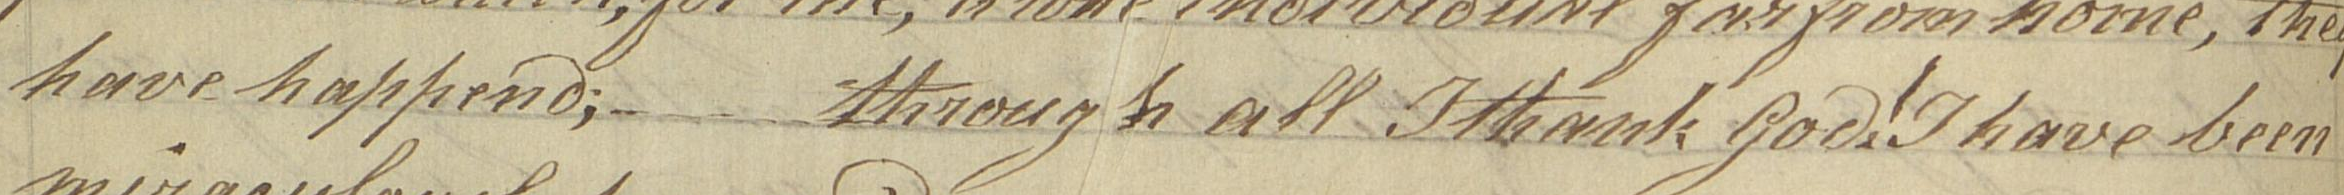have happend; through all I thank God! I have been
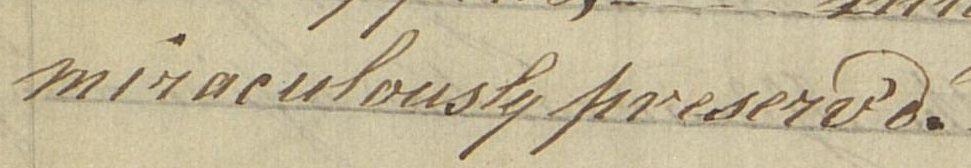miraculously preserv'd.
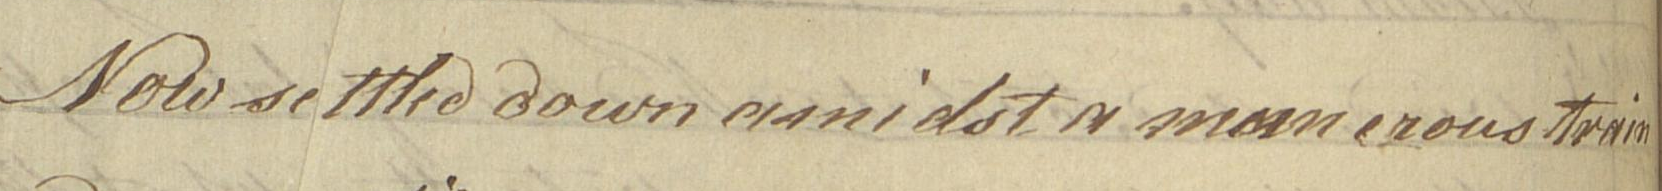Now settled down amidst a munerous train
